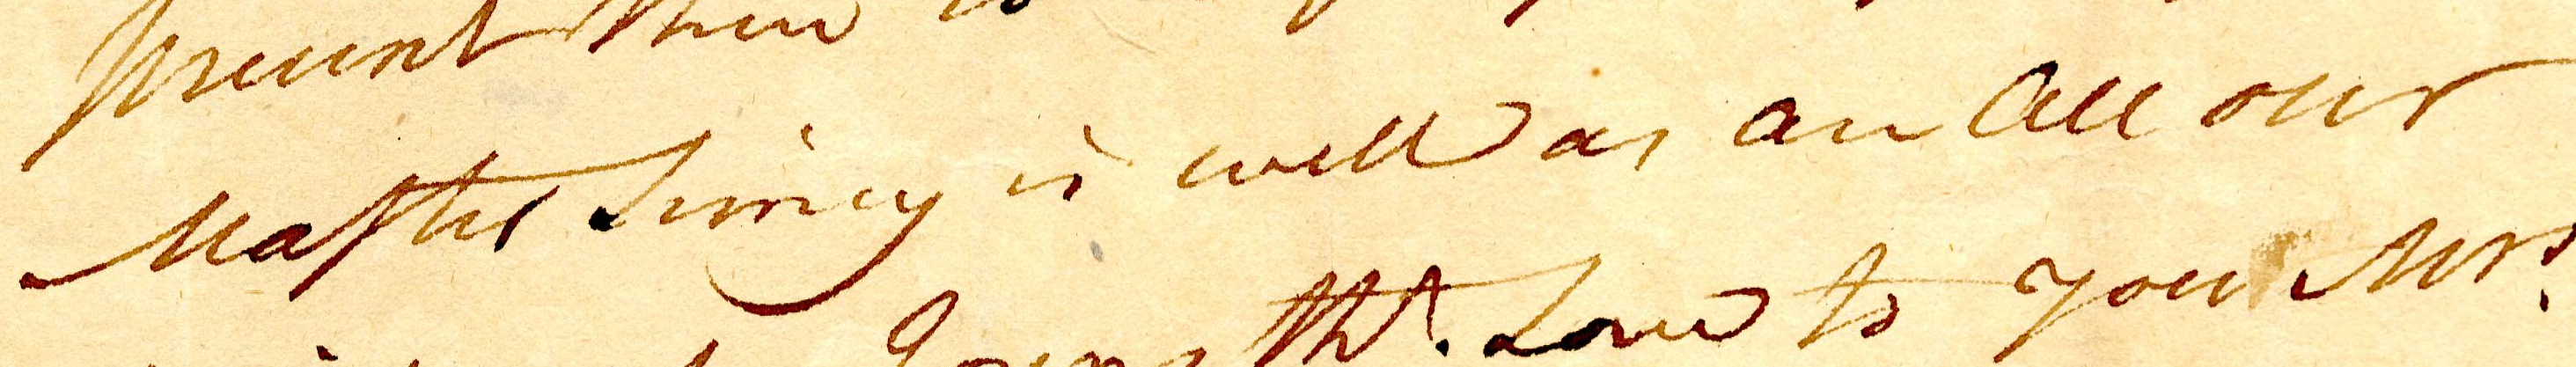Master Simon is well as are all our
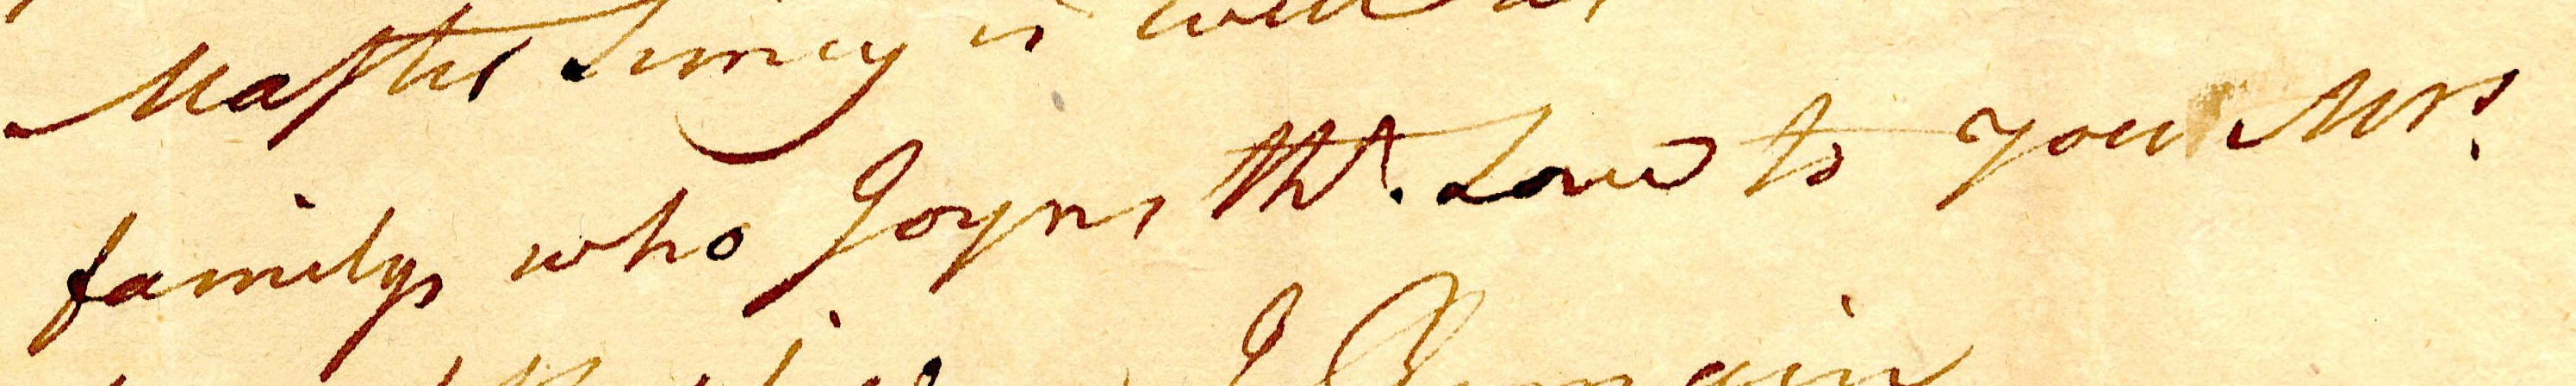family who Joyns th^r. Love to you M^rs.
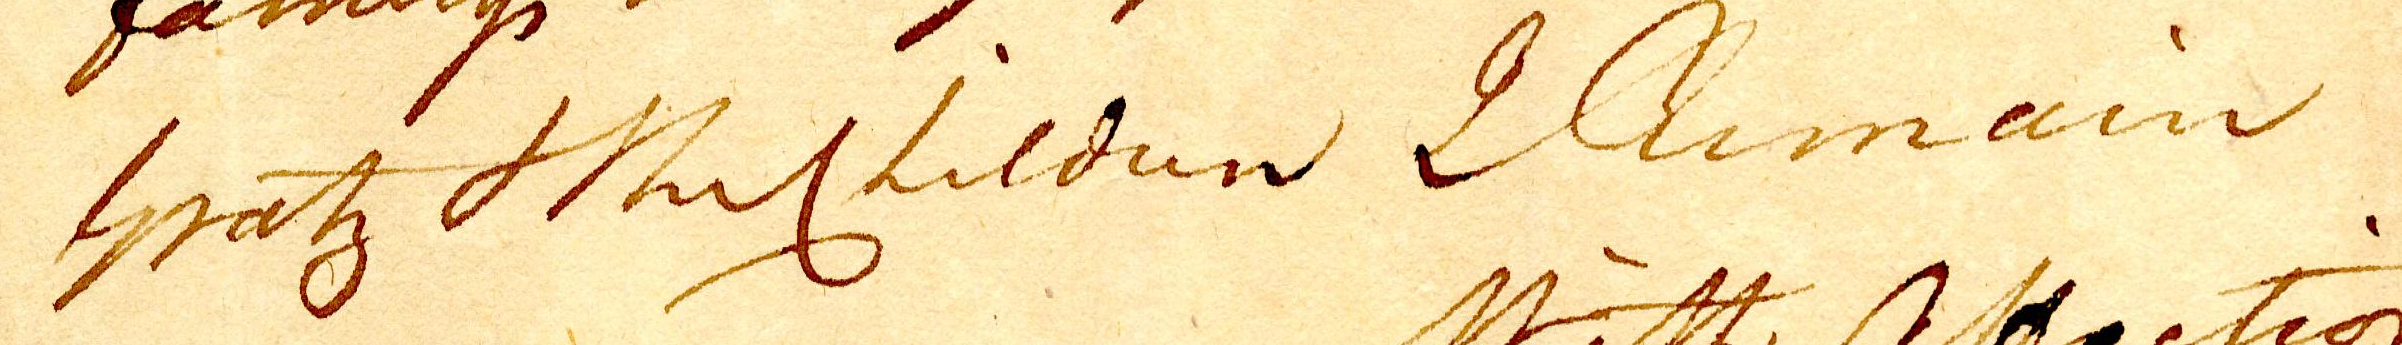Gratz & the Children I Remain
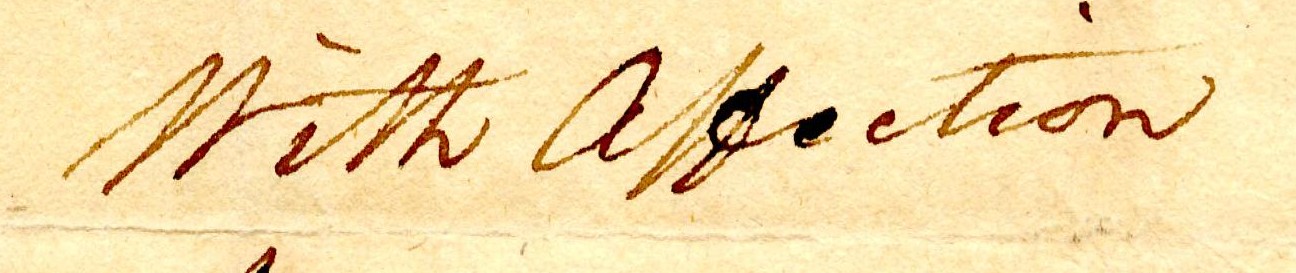With Afffection
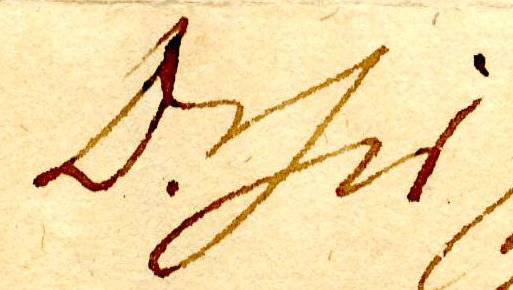D^r. Sir
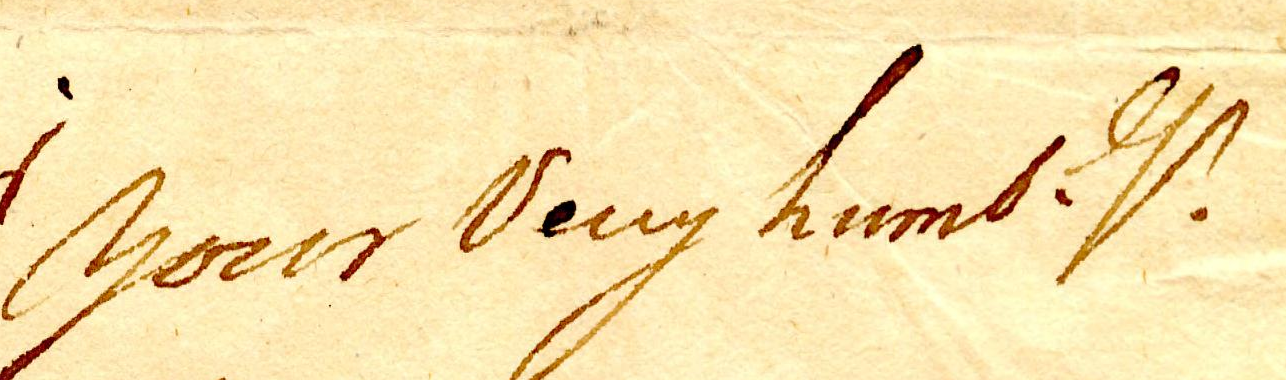Your Very hum^l S^t.
